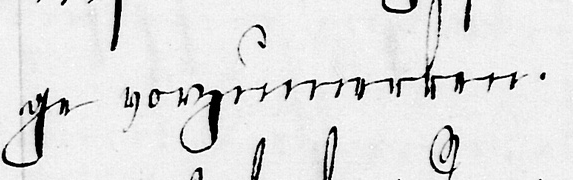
ge vorzumerken.
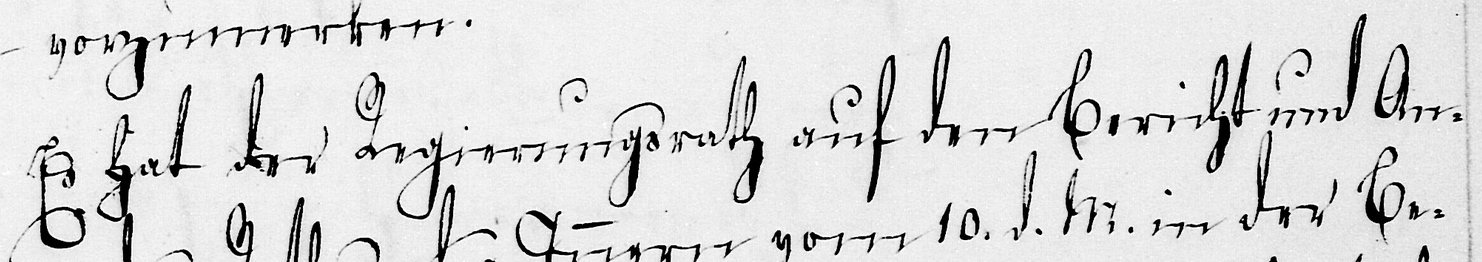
Es hat der Regierungsrath auf den Bericht und An¬
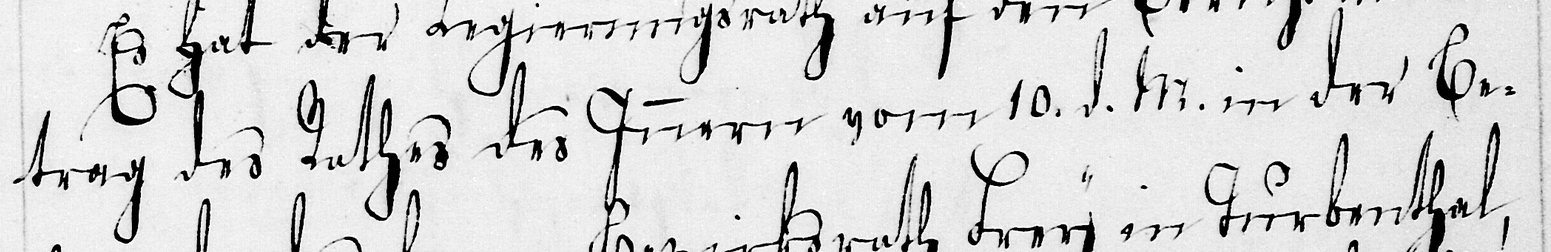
trag des Rathes des Innern vom 10. d. M. in der Be¬
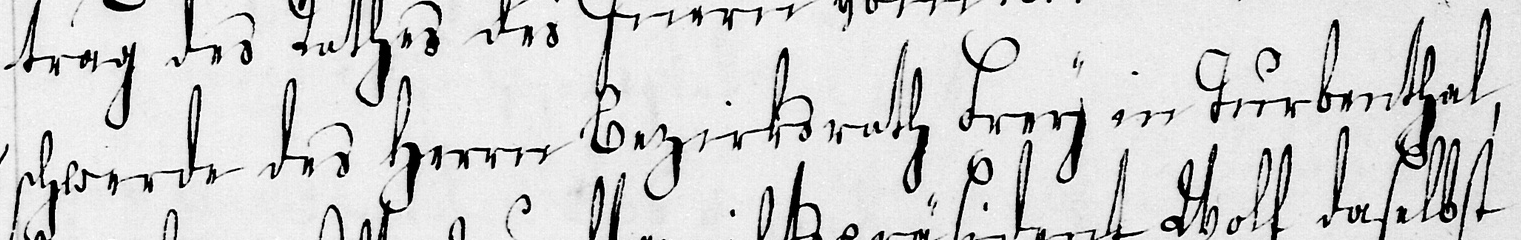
schwerde des Herrn Bezirksrath Frey in Turbenthal,
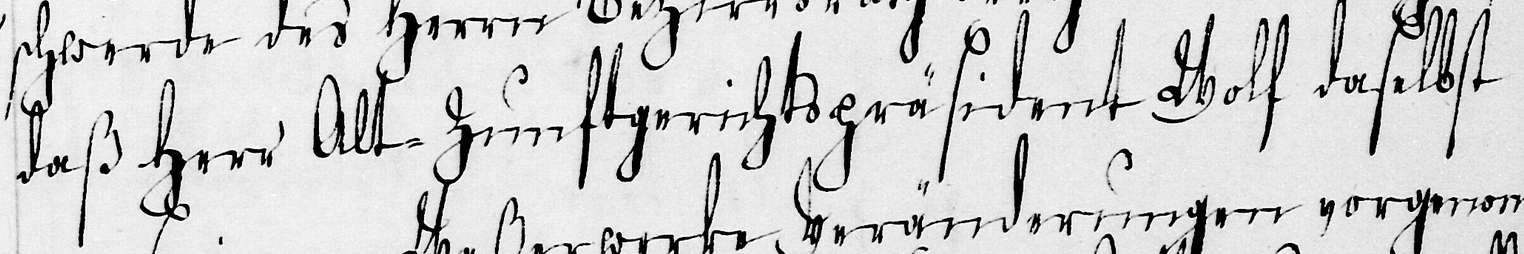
daß Herr Alt-Zunftgerichtspräsident Wolf daselbst
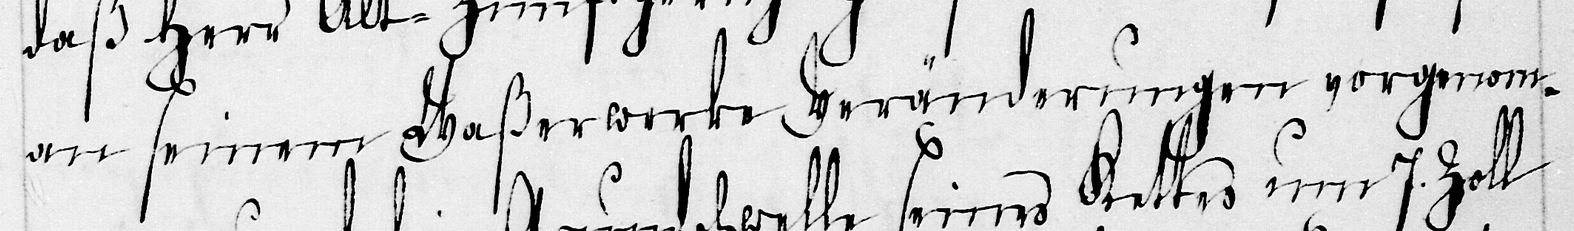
an seinem Waßerwerke Veränderungen vorgenom¬
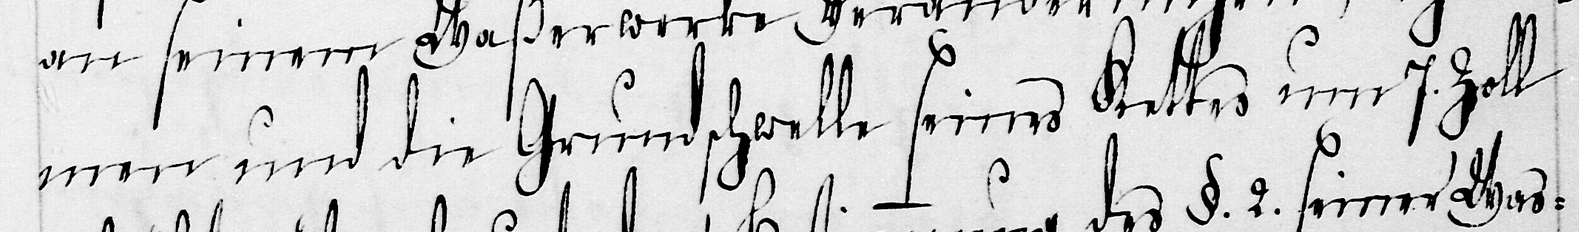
men und die Grundschwelle seines Kettes um 7. Zol¬
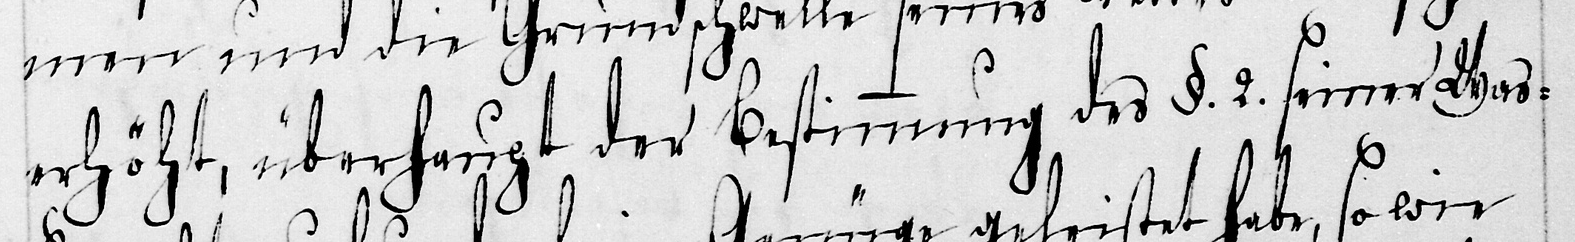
erhöht, überhaupt der Bestimmung des §. 2. seiner Waß¬
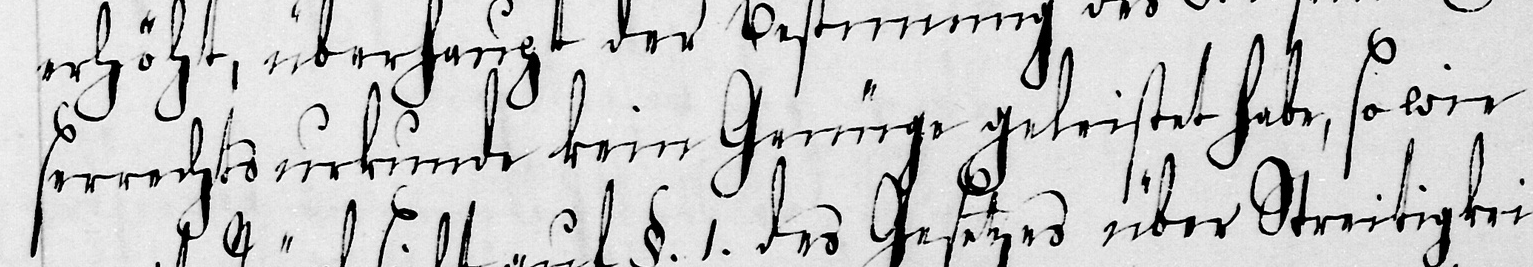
errechtsurkunde kein Genüge geleistet habe, sowie
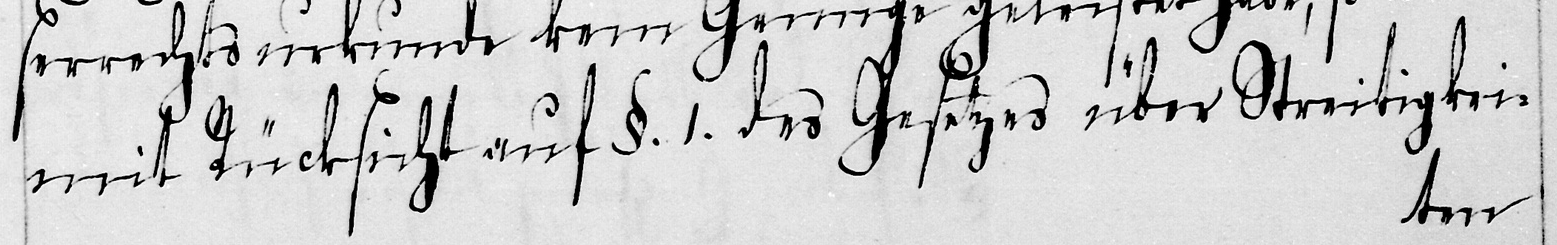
mit Rücksicht auf §. 1. des Gesetzes über Streitigkei-
